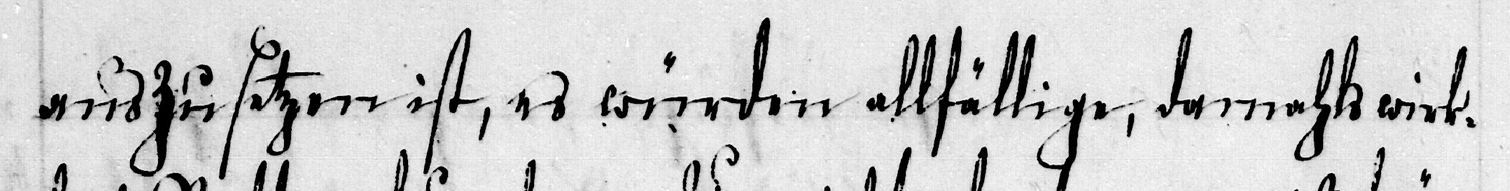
auszusetzen ist, es würden allfällige, damahls wirk¬
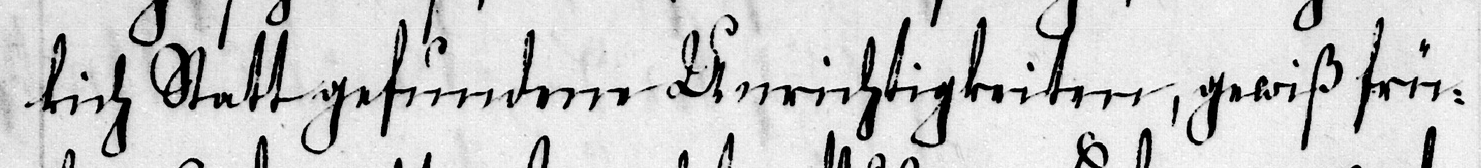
lich Statt gefundene Unrichtigkeiten, gewiß frü¬
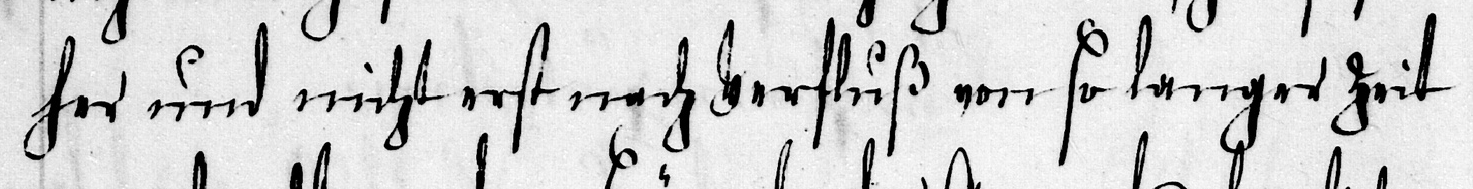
her und nicht erst nach Verfluß von so langer Zeit
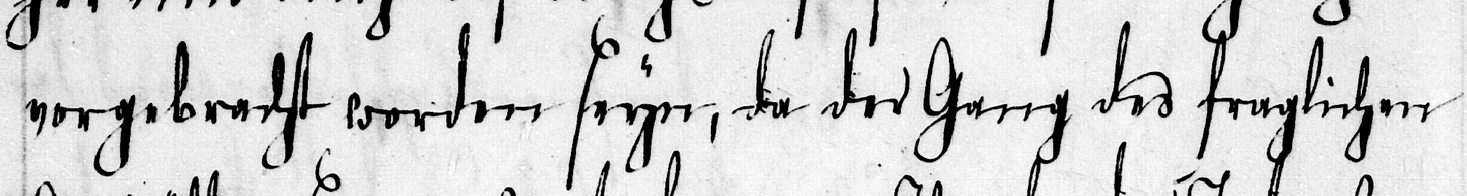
vorgebracht worden seyn, da der Gang des fraglichen
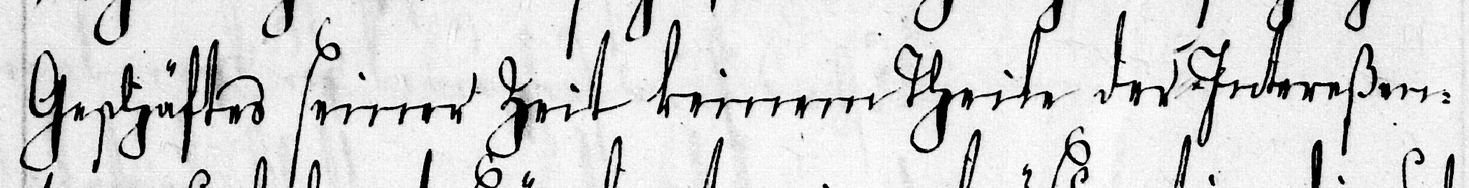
Geschäftes seiner Zeit keinem Theile der Intereßen¬
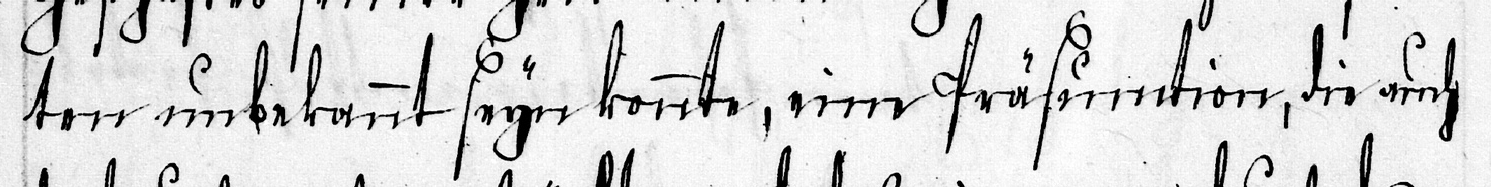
ten unbekannt seyn konnte, eine Präsumtion, die auch
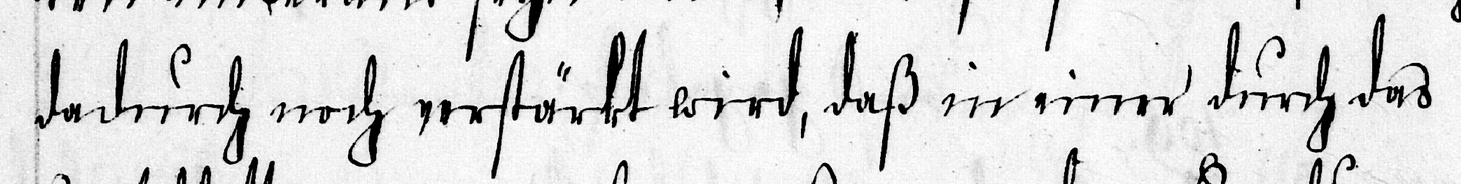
dadurch noch verstärkt wird, daß in einer durch das
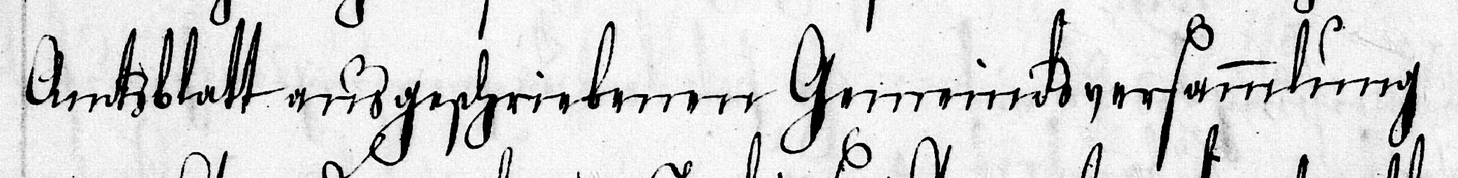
Amtsblatt ausgeschriebenen Gemeindsversammlung
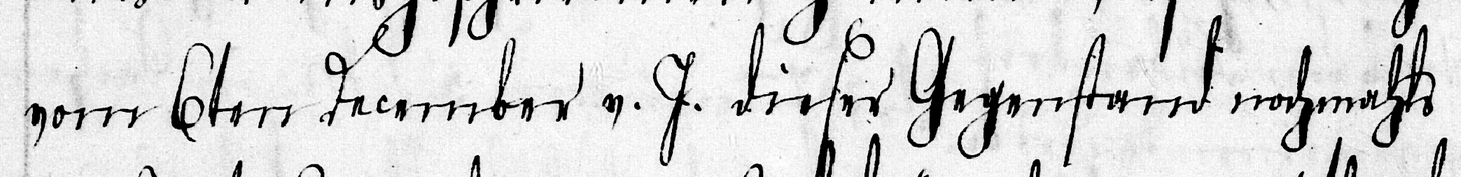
vom 6ten December v. J. dieser Gegenstand nochmahls
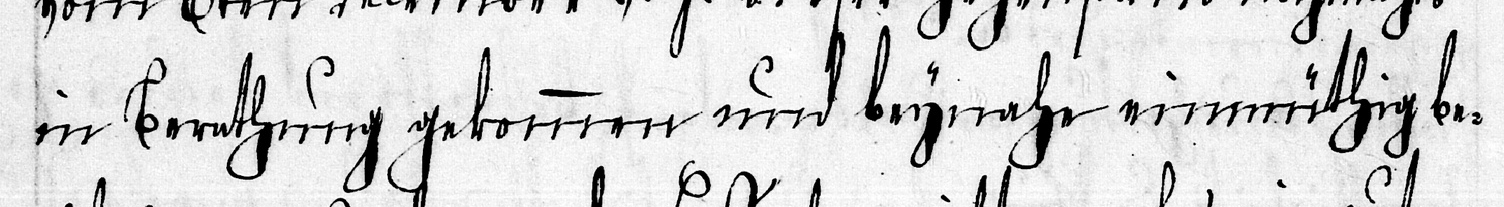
in Beratung gekommen und beynahe einmüthig be¬
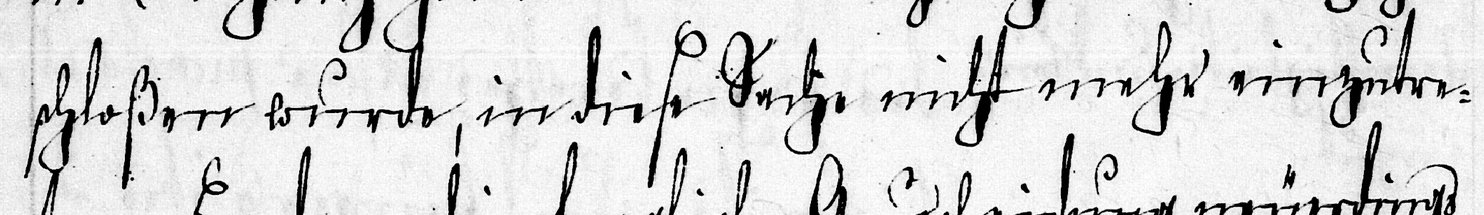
schloßen wurde, in diese Sache nicht mehr einzutre¬
